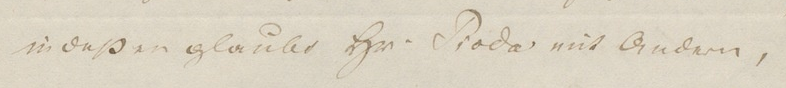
indeßen glaubt Hr. Pioda mit Andern,
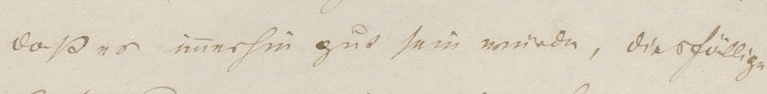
daß es immerhin gut sein würde, diesfällige
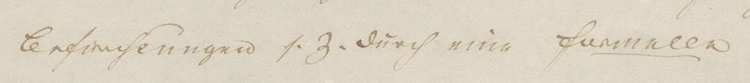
Befürchtung s. Z. durch eine formelle
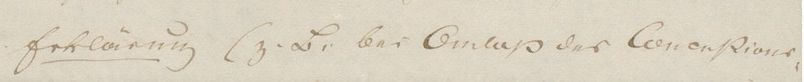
Erklärung (z. B. bei Anlaß des Conceßions-
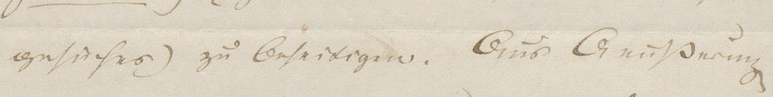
gesuches) zu beseitigen. Aus Aeußerungen
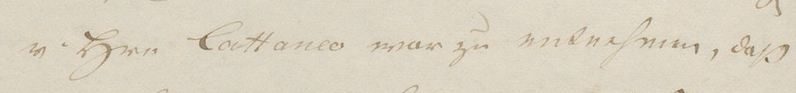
v. Hrn Cattaneo war zu entnehmen, daß
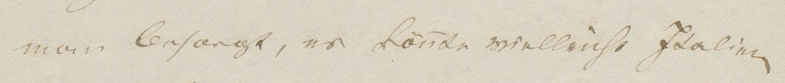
man besorgt, es könnte vielleicht Italien
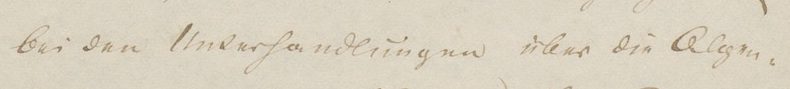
bei den Unterhandlungen über die Alpen -
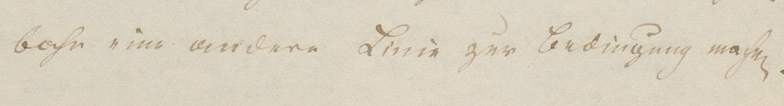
bahn eine andere Linie zur Bedingung machen.
